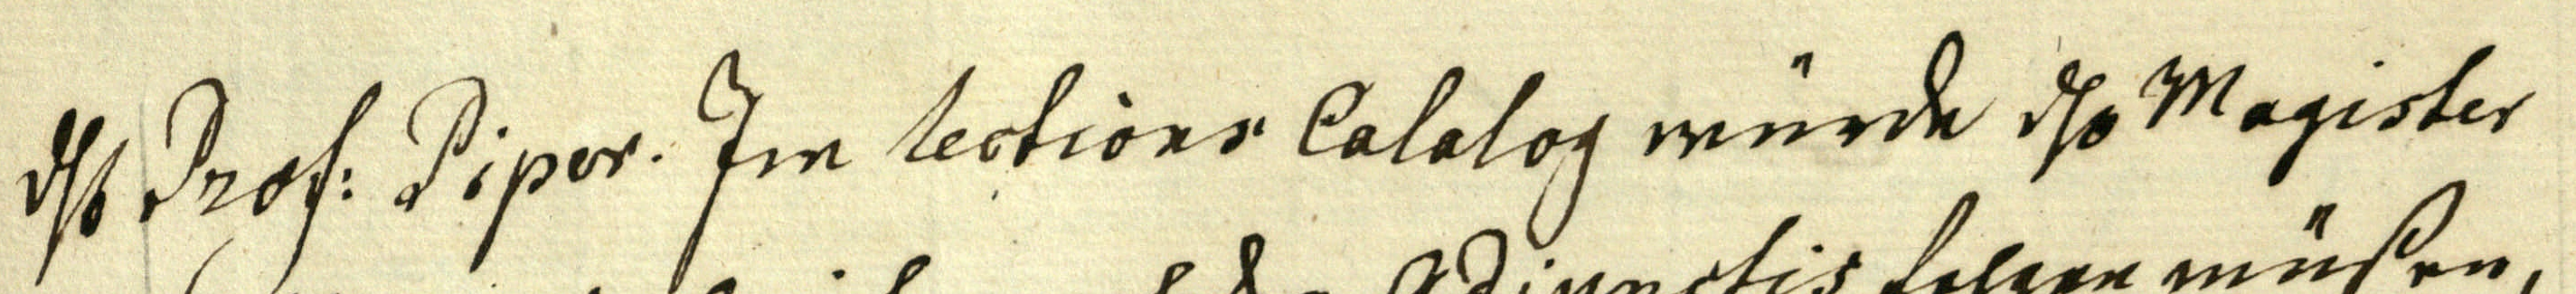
dh Prof. Piper. Im Lections Catalog würde dh Magister
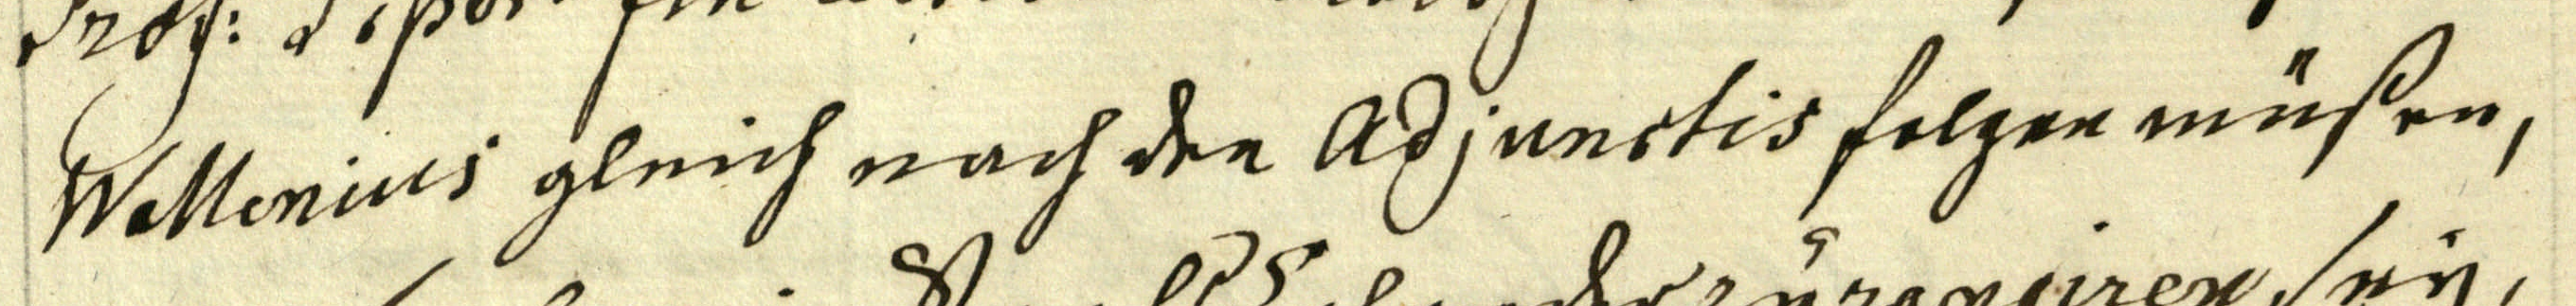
Wallenius gleich nach den Adjunctis folgen müßen,
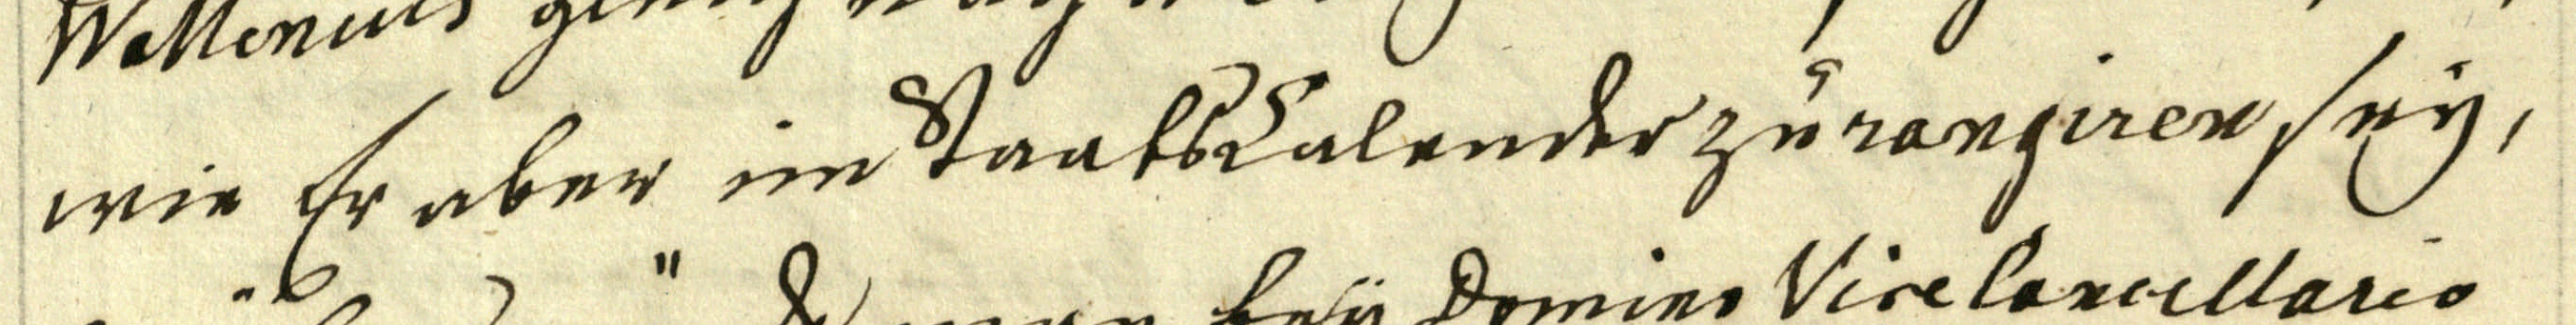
wie Er aber im Staatskalender zurangiren seÿ,
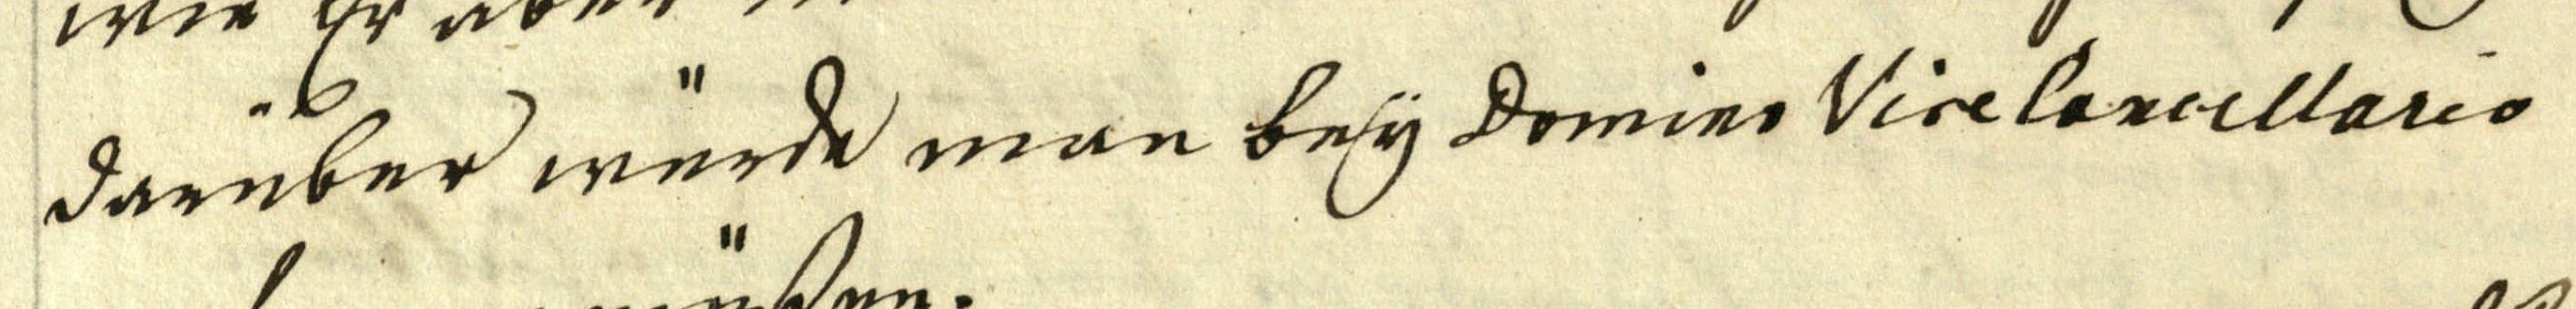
darüber würde man beÿ Domino Vice Cancellario
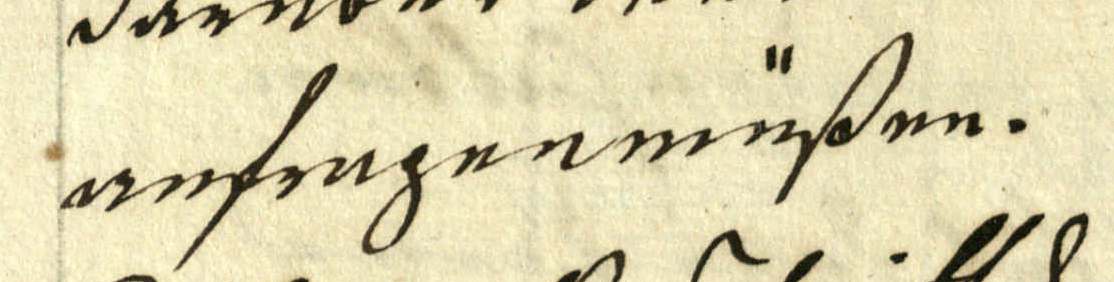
anfragenmüßen.
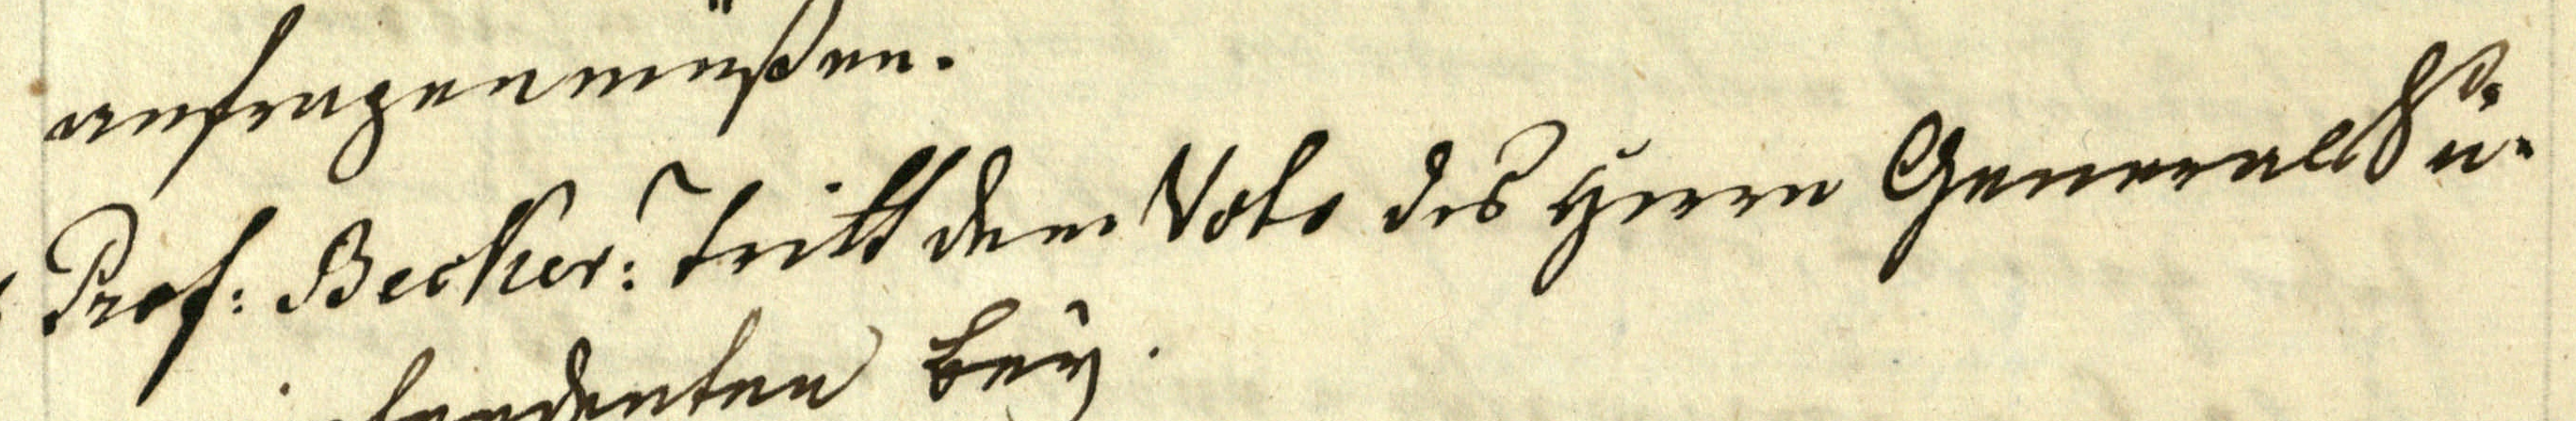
dh Prof. Becker tritt dem Voto des Herrn GeneralSu¬
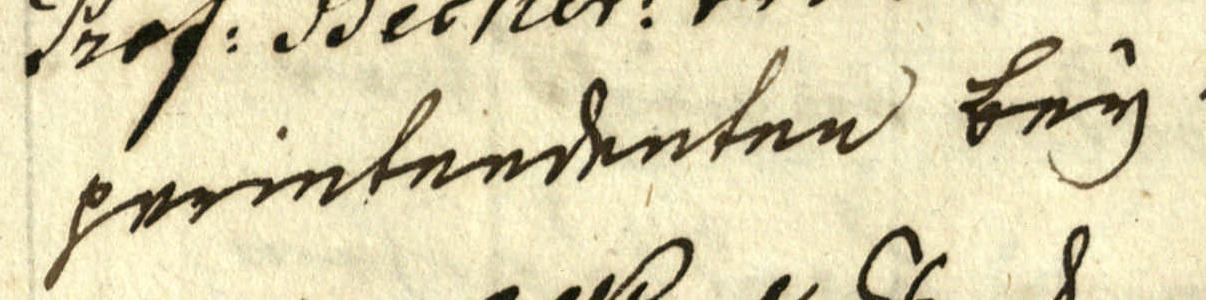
perintendenten beÿ.
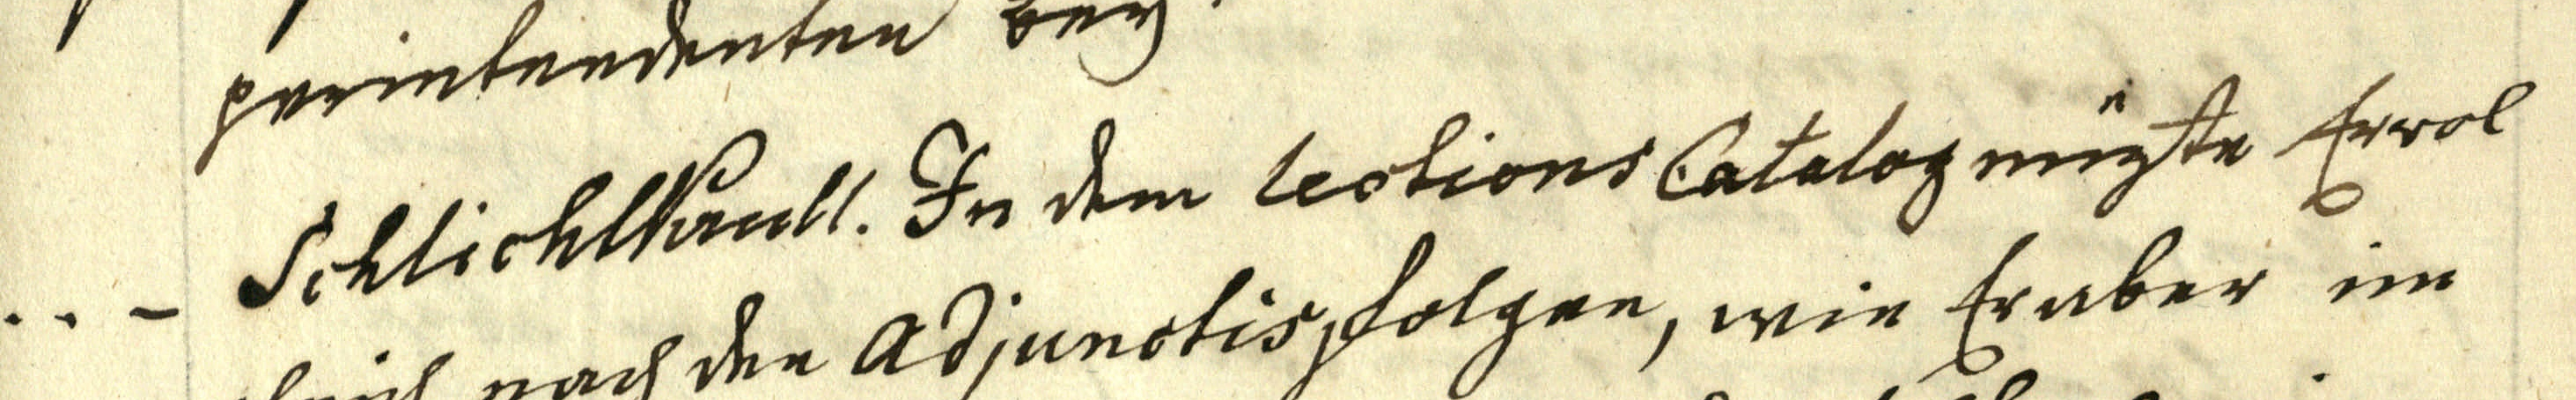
Schlichtkrull. In dem Lections Catalog müste Er wol
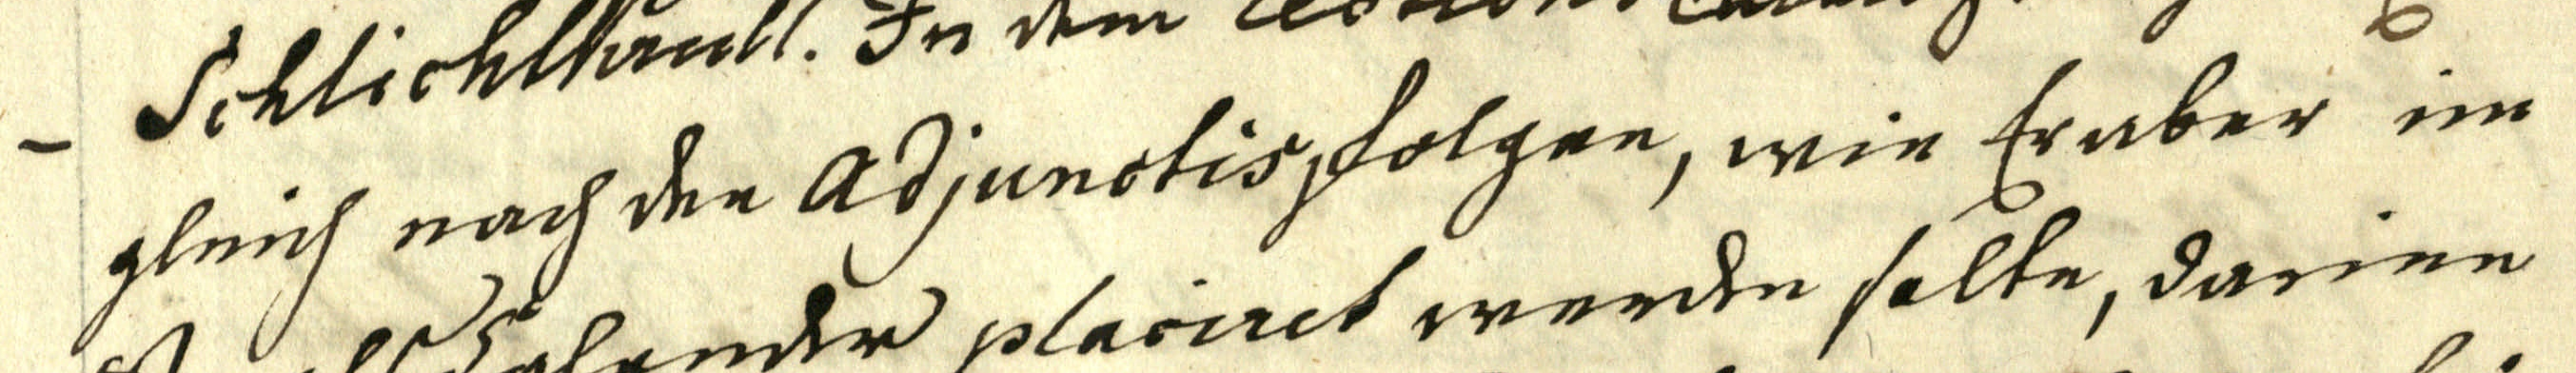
gleich nach den Adjunctis folgen, wie Er aber im
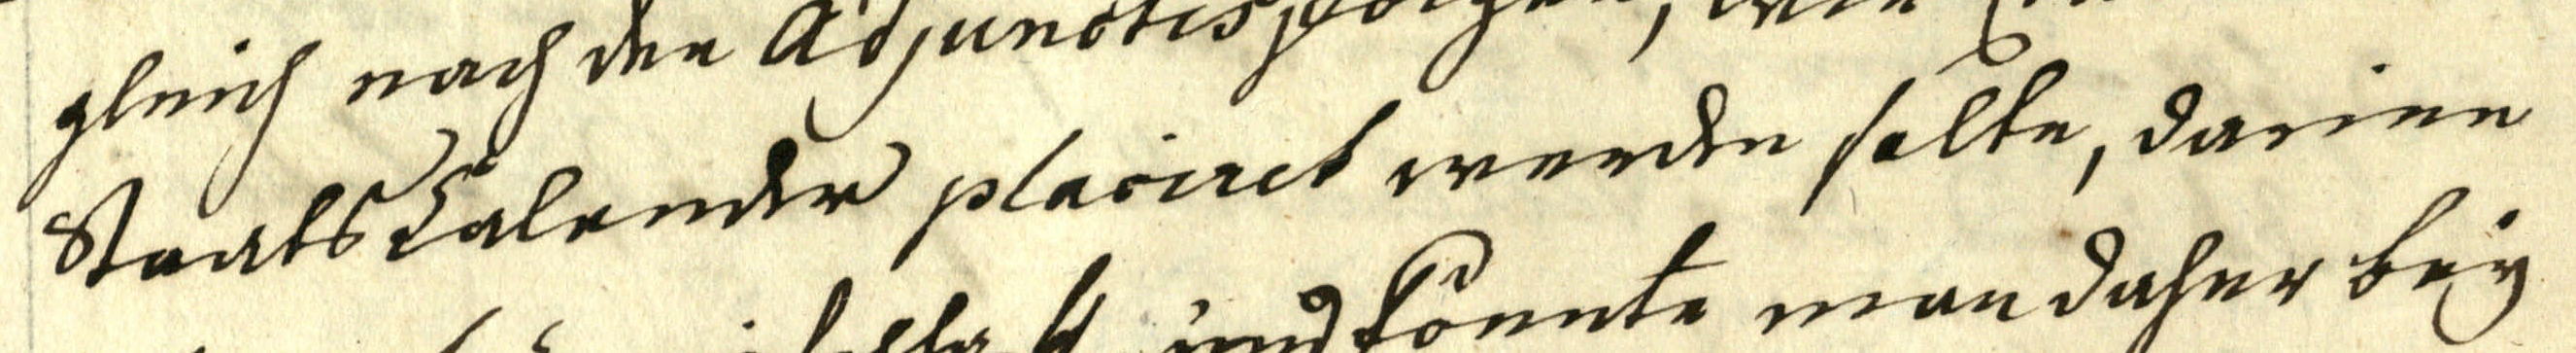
Staats Kalender placiret werden solte, darinn
